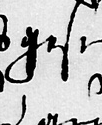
25.
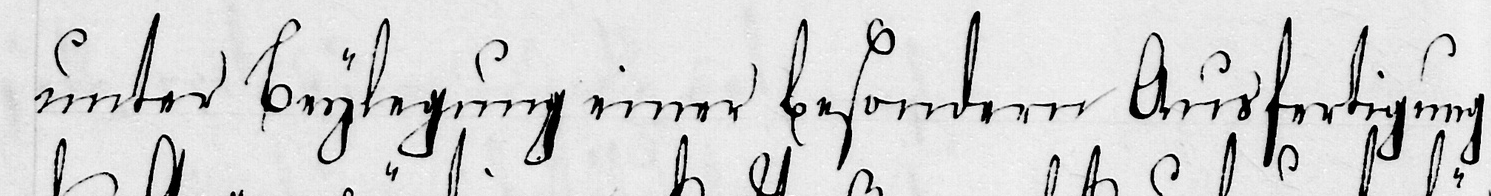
unter Beylegung einer besondern Ausfertigung
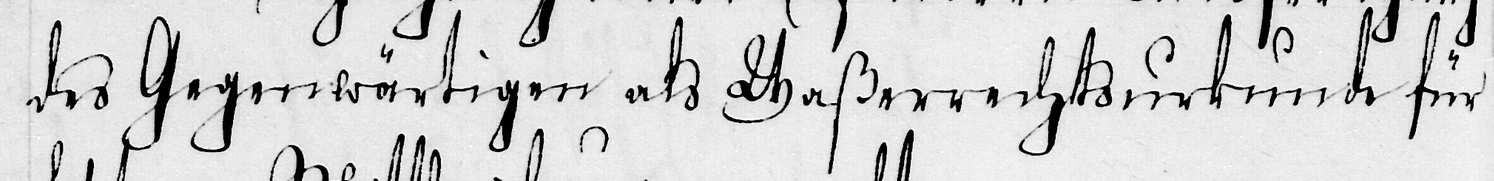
des Gegenwärtigen als Waßerrechtsurkunde für
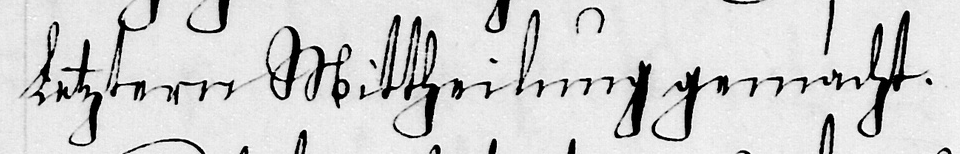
Letztern Mittheilung gemacht.
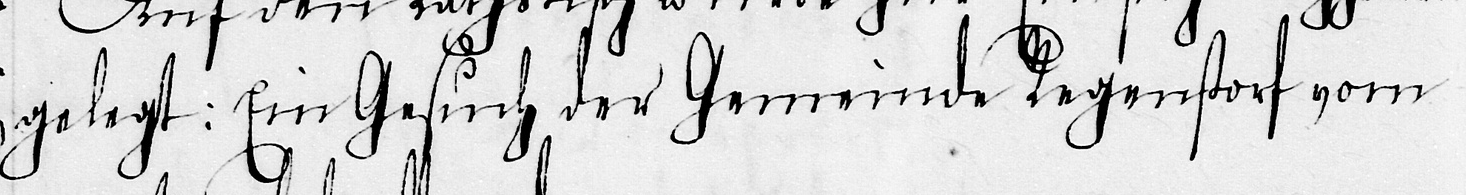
gelegt: Ein Gesuch der Gemeinde Regenstorf vom
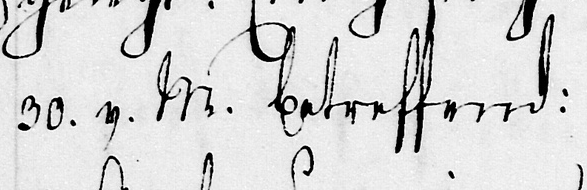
30. v. M. betreffend:
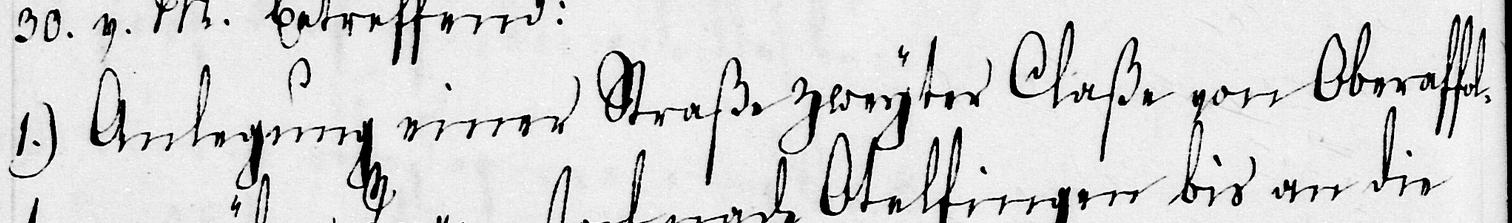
1.) Anlegung einer Straße zweyter Claße von Oberaffo¬
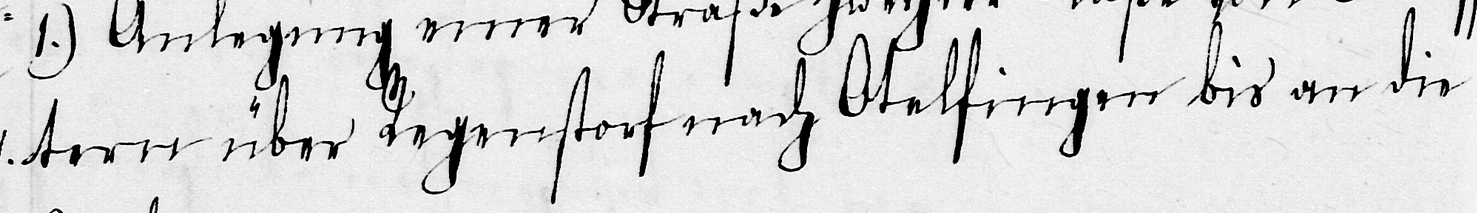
ltern über Regenstorf nach Otelfingen bis an die
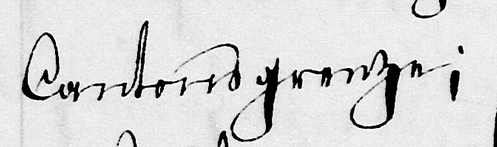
Cantonsgrenze;
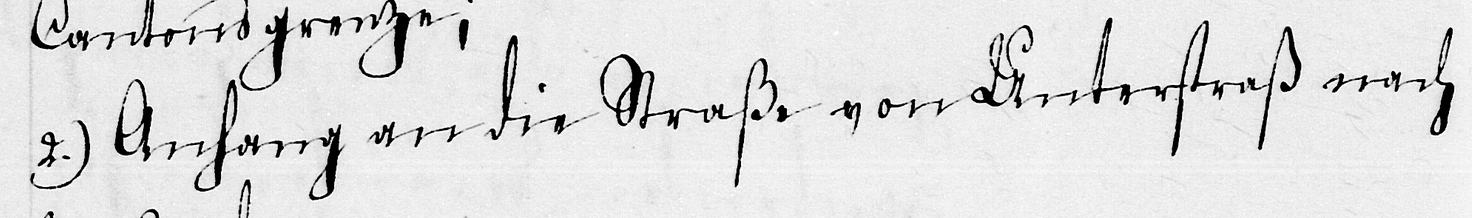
2.) Anhang an die Straße von Unterstraß nach
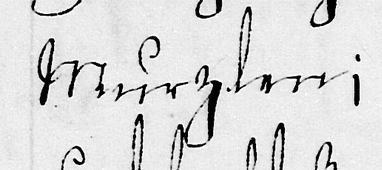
Murzlen;
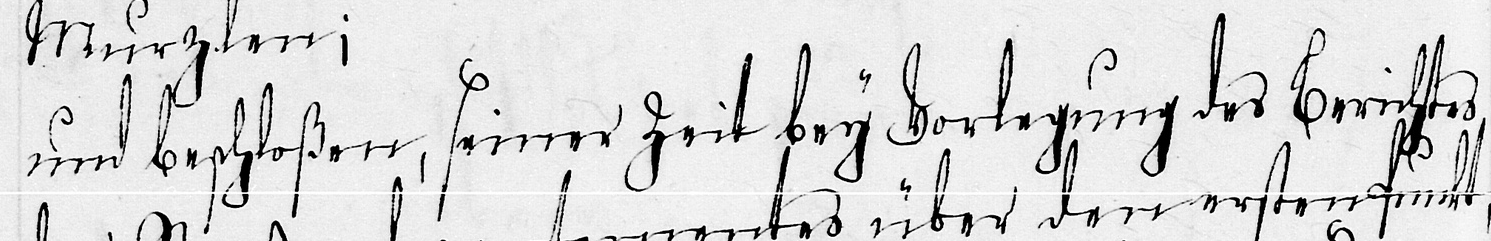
und beschloßen, seiner Zeit bey Vorlegung des Berichtes
